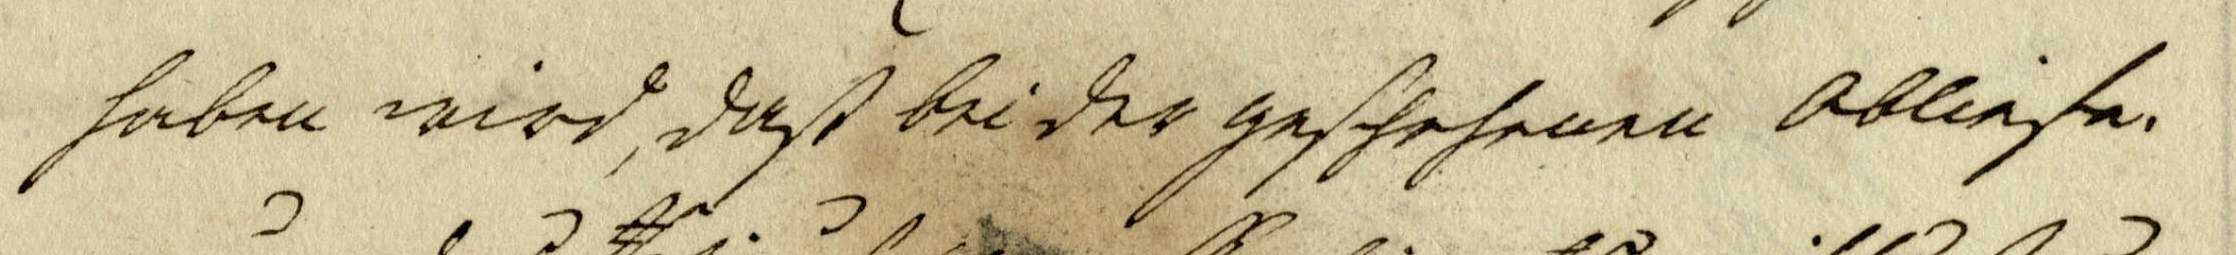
haben wird, daß bei der geschehenen Abliefe¬
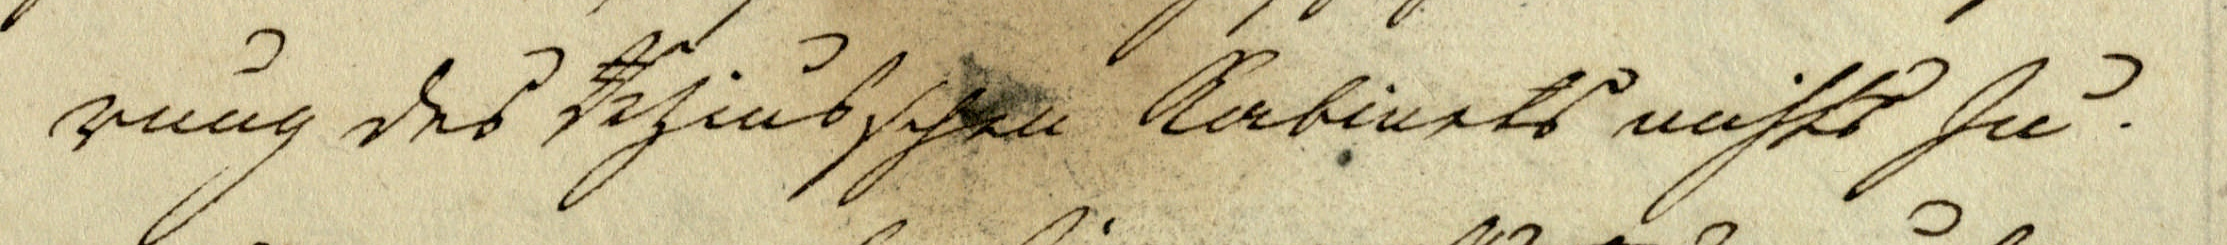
rung des Reziusschen Kabinets nichts zu
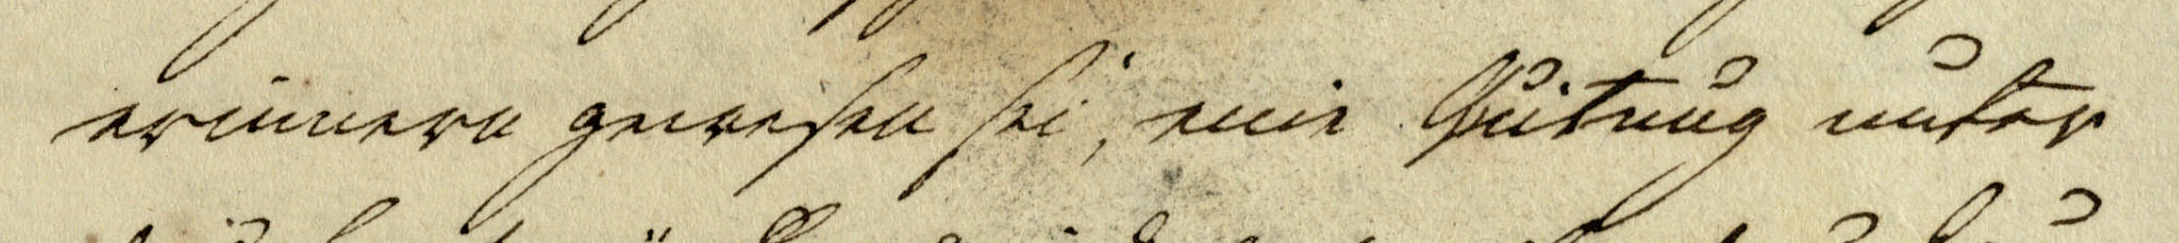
erinnern gewesen sei, eine Quitung unter
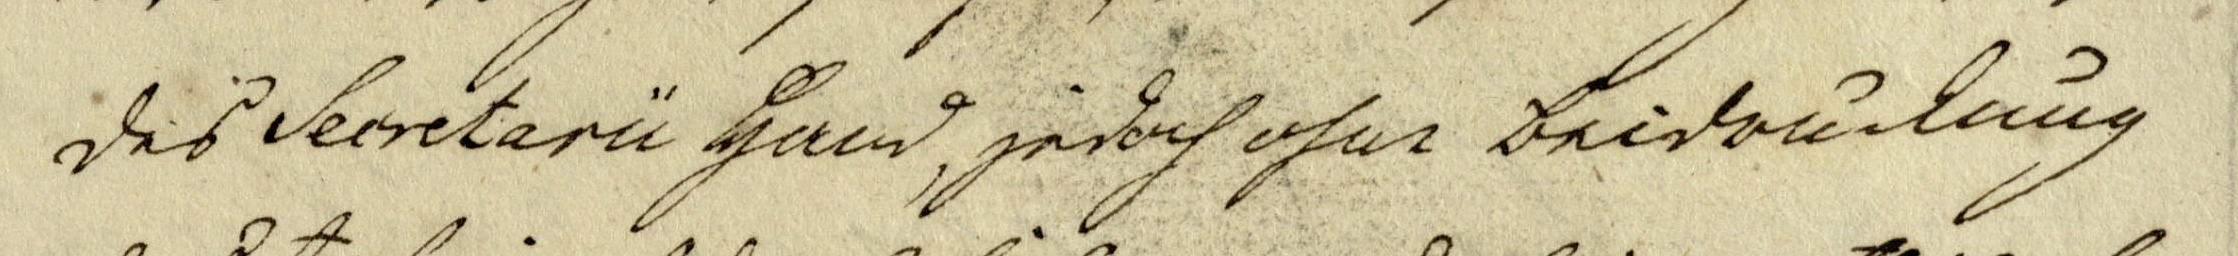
des Secretarii Hand, jedoch ohne Beidruckung
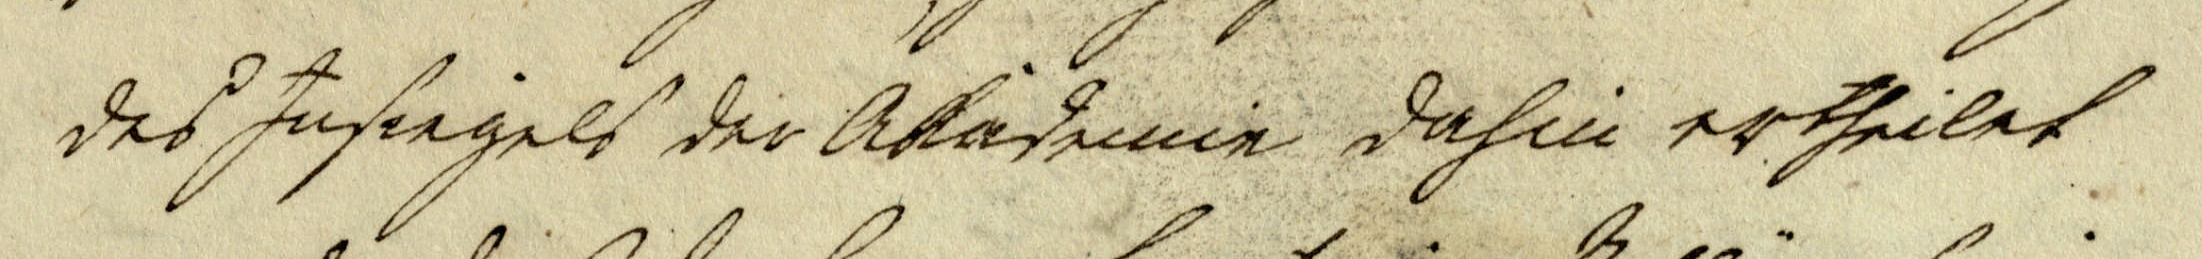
des Insiegels der Akademie dahin ertheilet
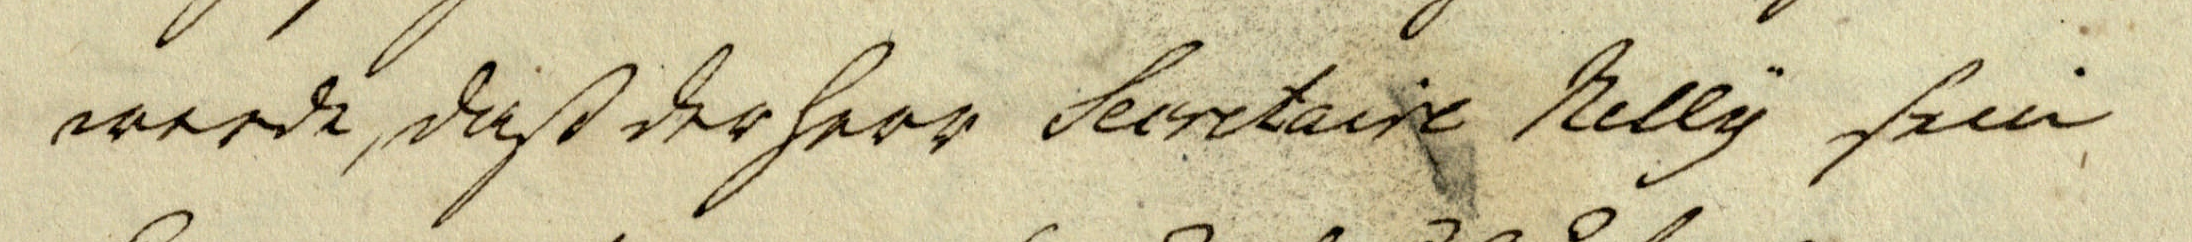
werde, daß der Herr Secretaire Nellÿ sein
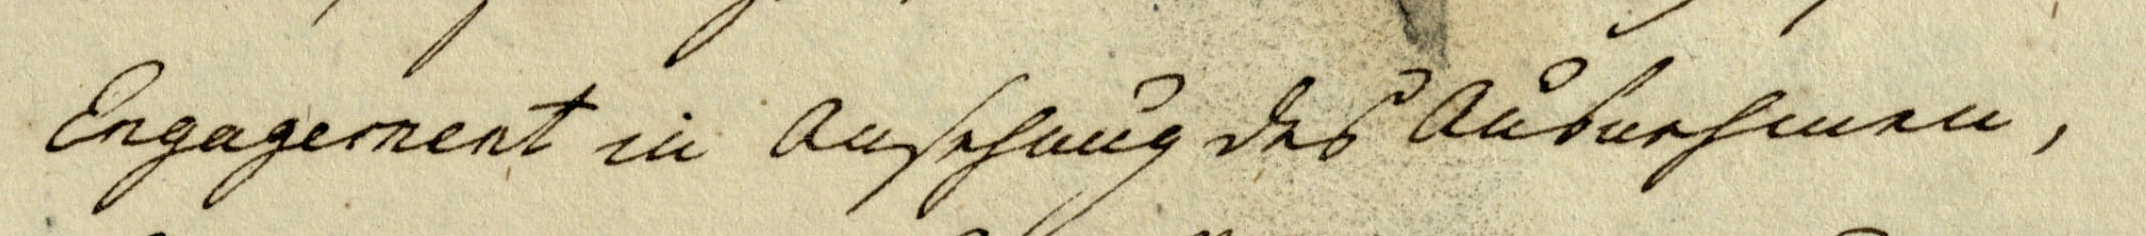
Engagement in Ansehung des Ausnehmen,
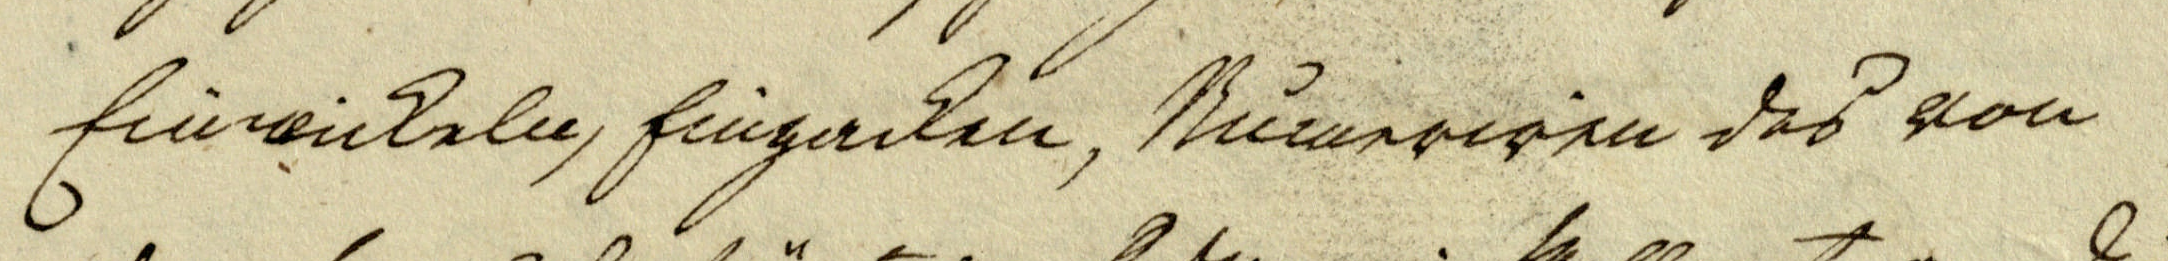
Einwickeln, Einpacken, Numeriren des von
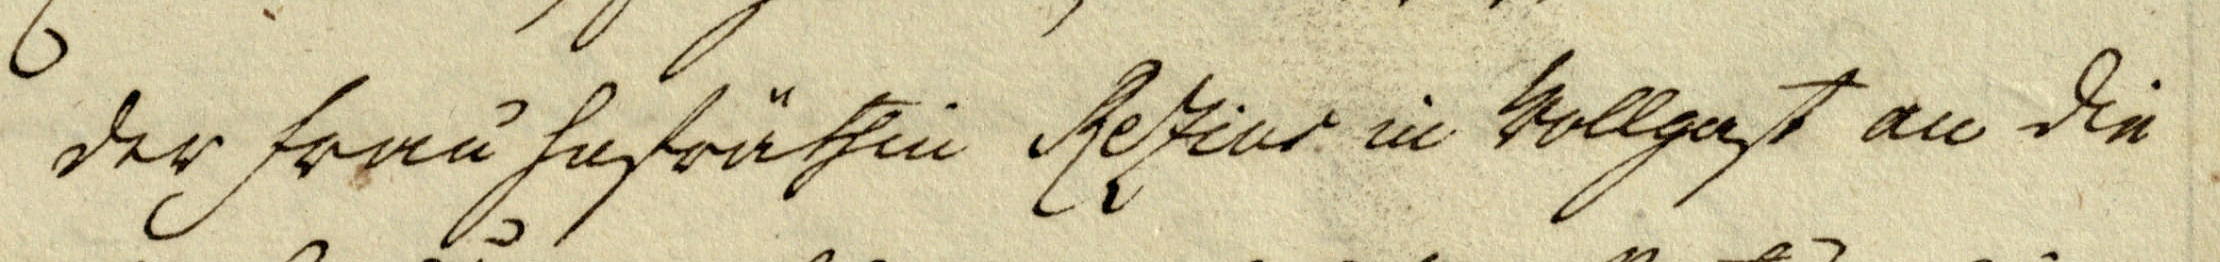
der Frau Hofräthin Rezius in Wollgast an die
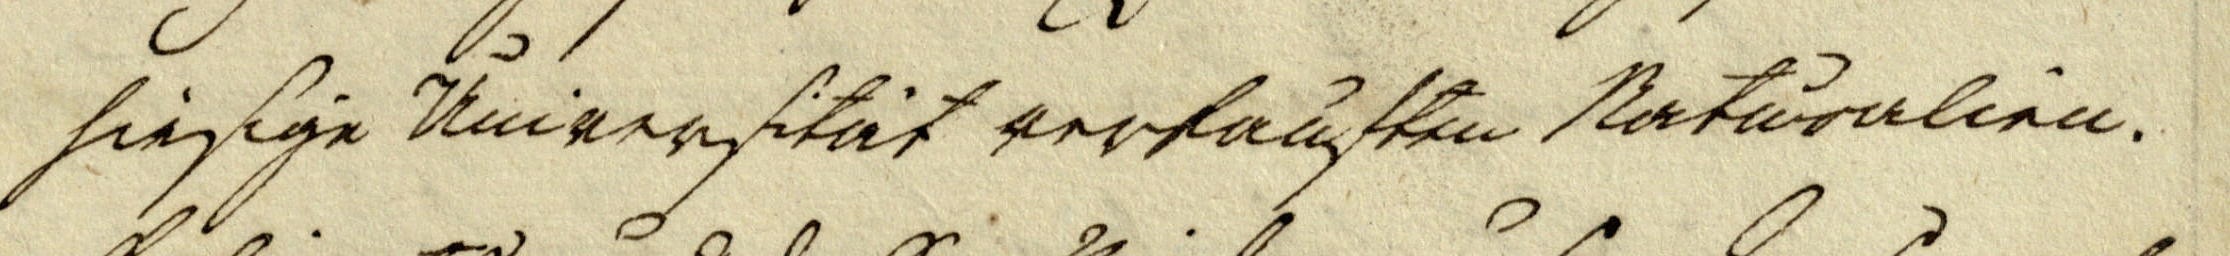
hiesige Universität verkauften Naturalien¬
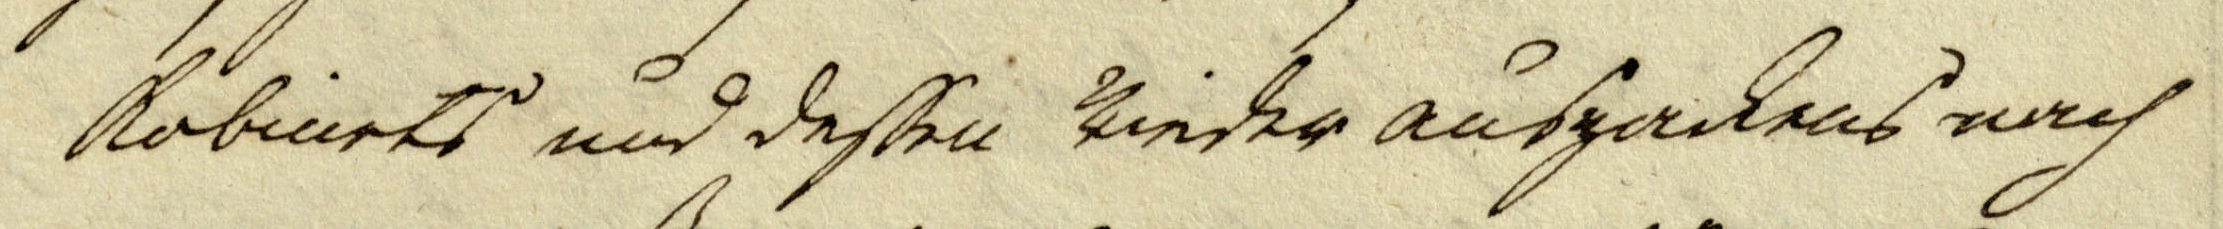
Kabinets und dessen Wiederauspackens nach
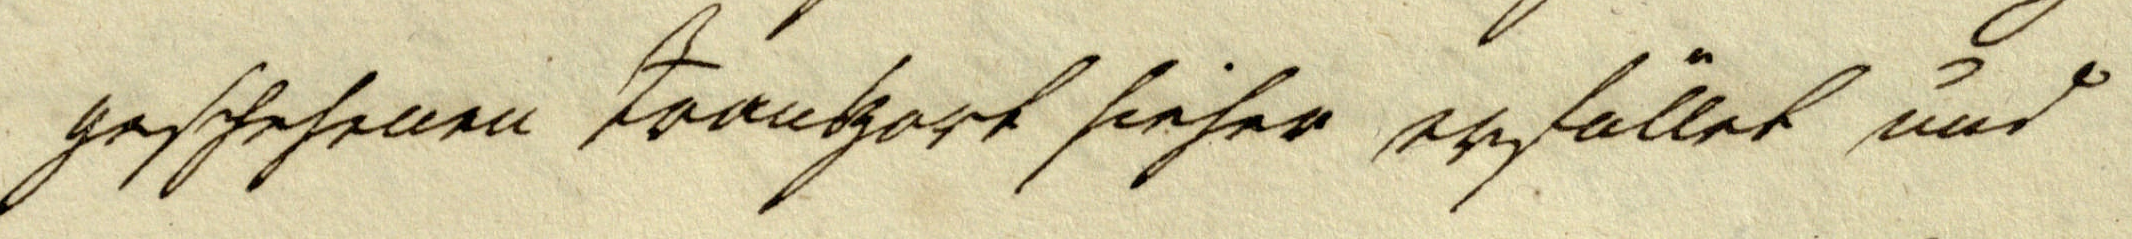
geschehenen Transport hieher erfüllet und
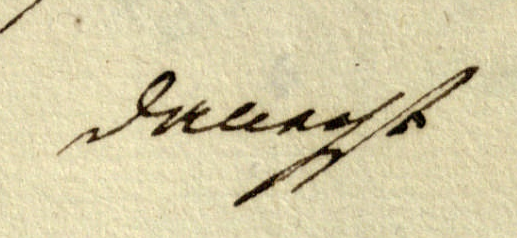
danechst
